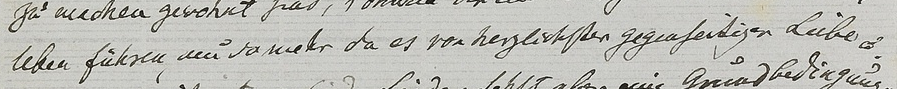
leben führen, um so mehr da es von herzlichster gegenseitiger Liebe u.
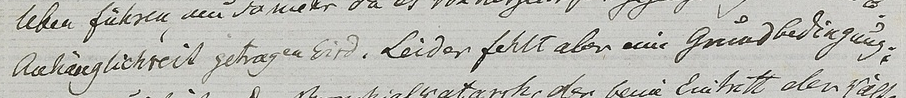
Anhänglichkeit getragen wird. Leider fehlt aber eine Grundbedingung:
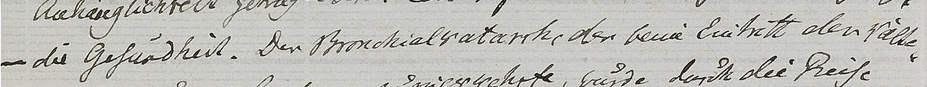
– die Gesundheit. Der Bronchialkatarrh, der beim Eintritt der kälte-
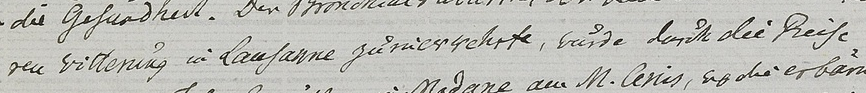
ren Witterung in Lausanne zurückkehrte, wurde durch die Reise
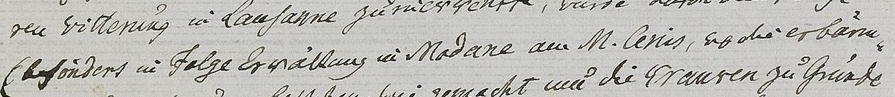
(besonders in Folge Erkältung in Modane am M. Cenis, wo die erbärm-
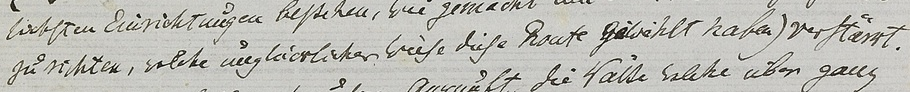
zu richten, welche unglücklicher Weise diese Route gewählt haben) verstärkt.
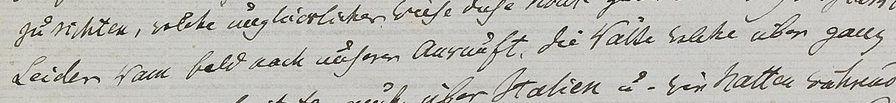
Leider kam bald nach unserer Ankunft, die Kälte welche über ganz
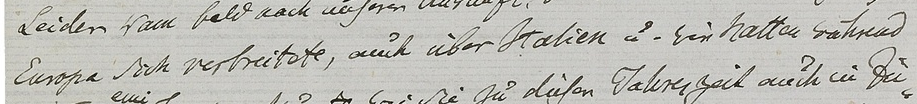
Europa sich verbreitete, auch über Italien u – wir hatten während
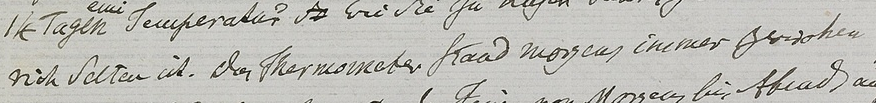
rich selten ist. Das Thermometer stand morgens immer zwischen
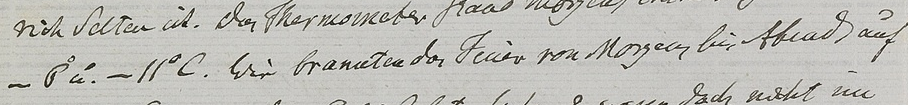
-6° u. -11° C. Wir brannten das Feuer von Morgens bis Abends auf
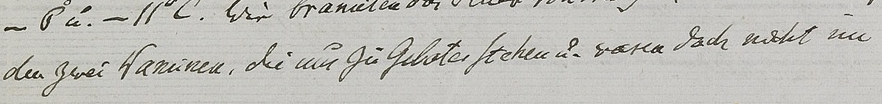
den zwei Kaminen, die uns zu Gebote stehen u. waren doch nicht im
